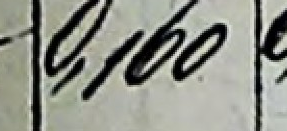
0,160
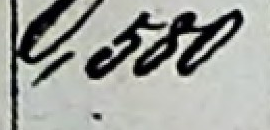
0,580
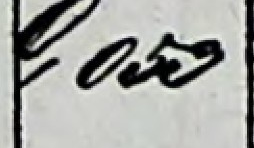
0,053
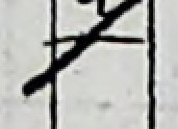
7
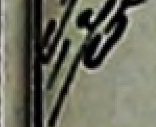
3,75
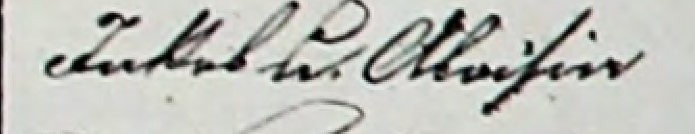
Jakob u. Aloisia
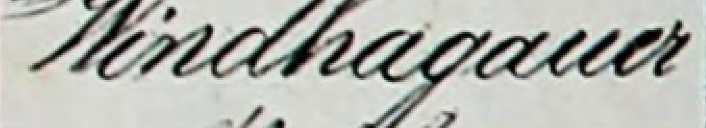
Windhagauer
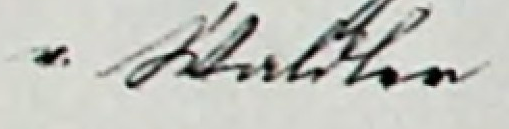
v. Waldter
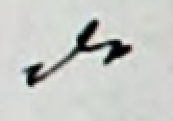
do
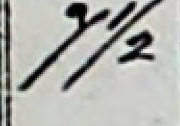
7 ½
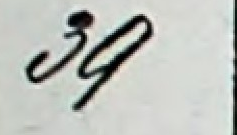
39
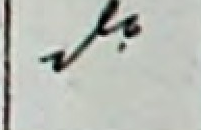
do
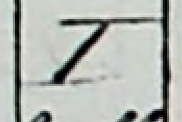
I
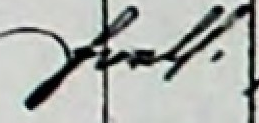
forts.
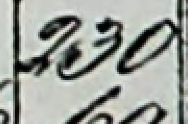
230
